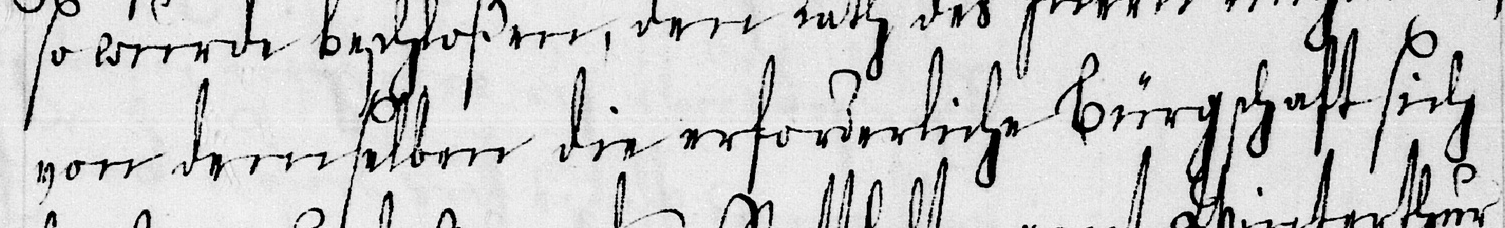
von demselben die erforderliche Bürgschaft sich
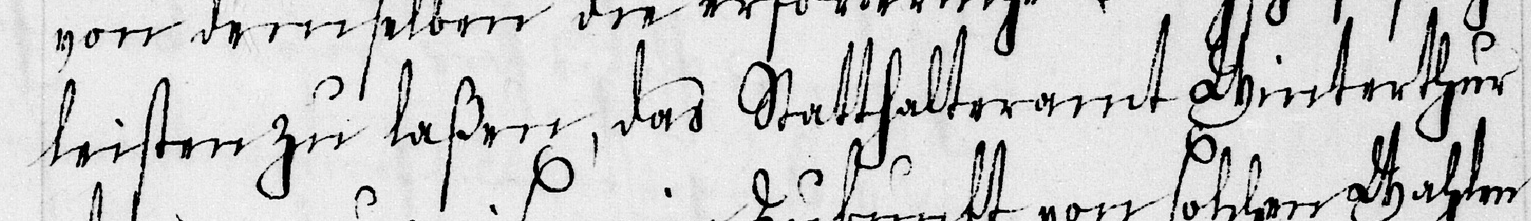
leisten zu laßen, das Statthalteramt Winterthur
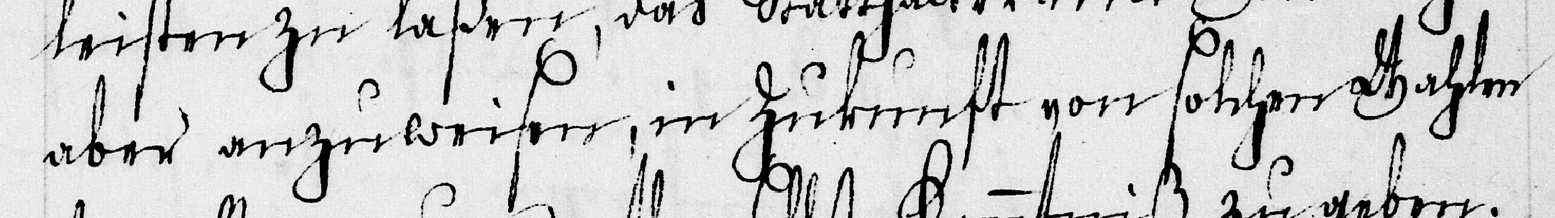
aber anzuweisen, in Zukunft von solchen Wahlen
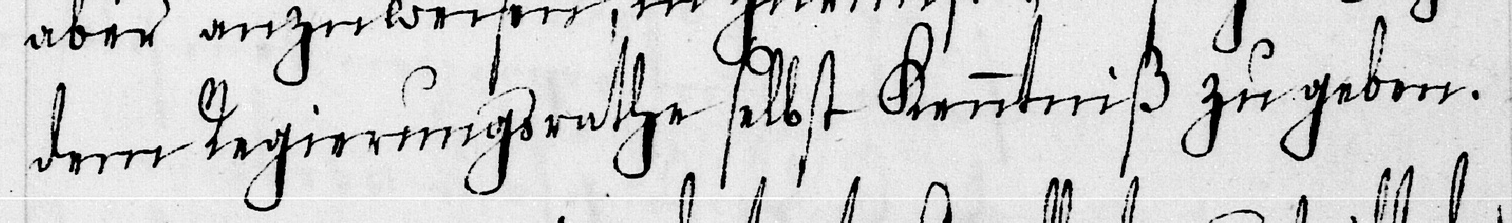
dem Regierungsrathe selbst Kenntniß zu geben.
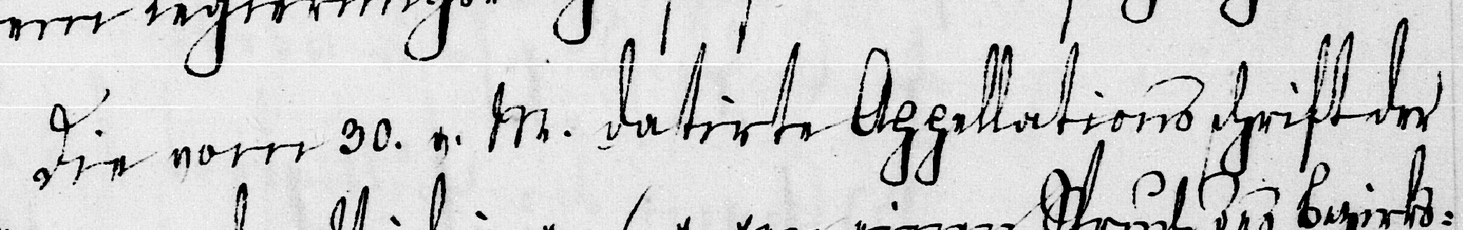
Die vom 30. v. M. datirte Appallationsschrift der
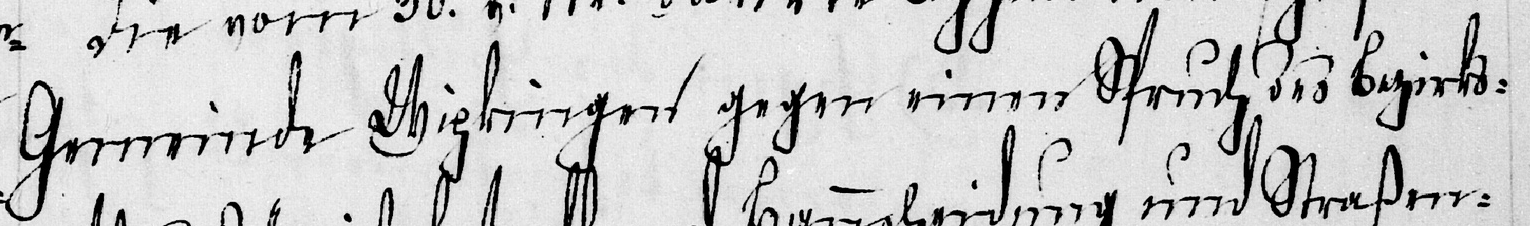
Gemeinde Wipkingen gegen einen Spruch des Bezirks¬
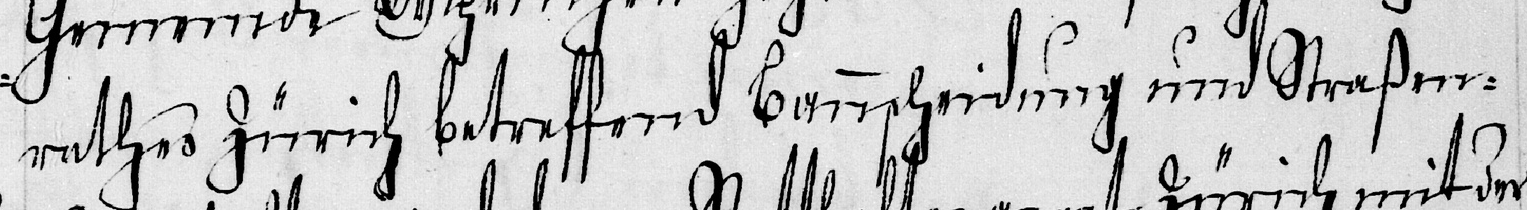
rathes Zürich betreffend Bannscheidung und Straßen¬
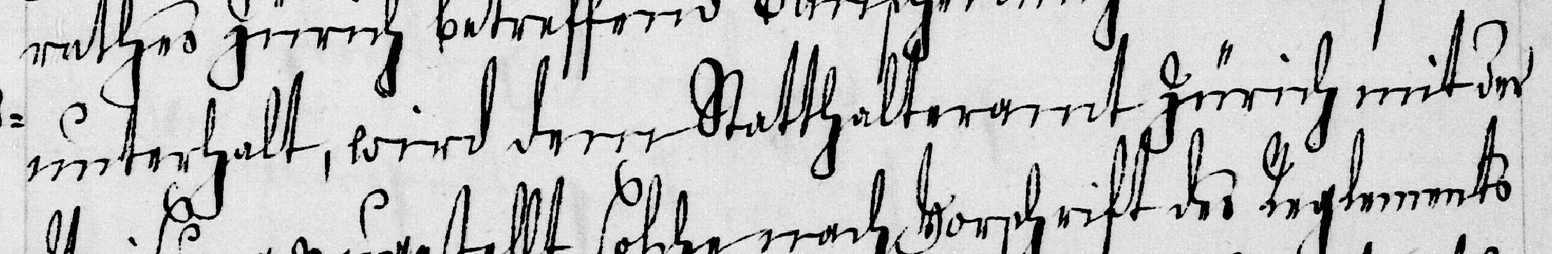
unterhalt, wird dem Statthalteramt Zürich mit der
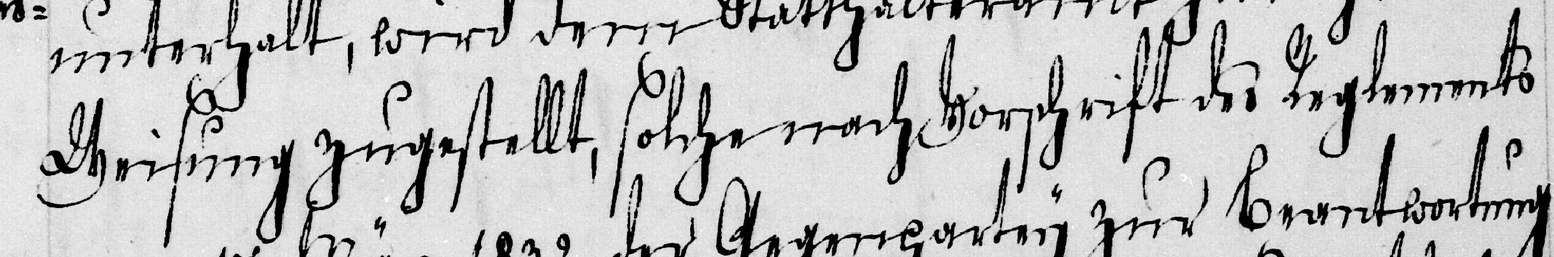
Weisung zugestellt, solche nach Vorschrift des Reglements
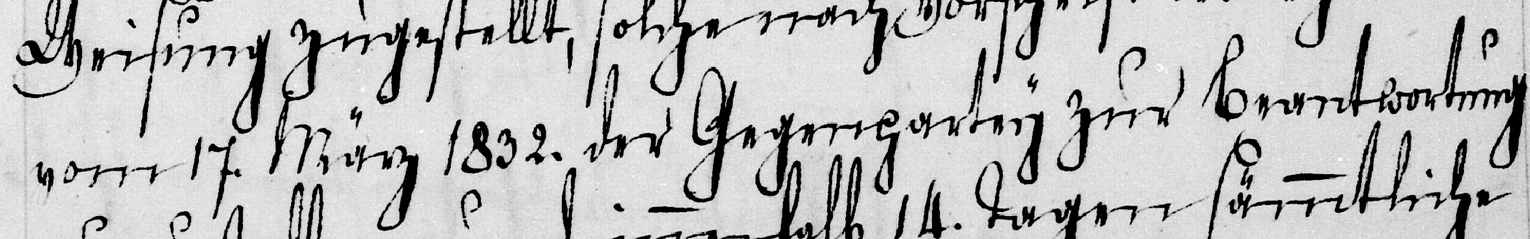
vom 17. März 1832. der Gegenpartey zur Beantwortung
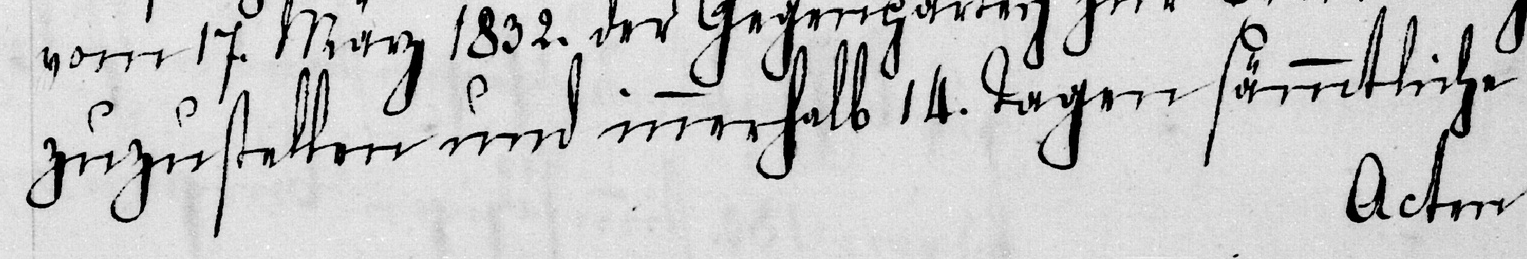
zuzustellen und innerhalb 14. Tagen sämmtliche
